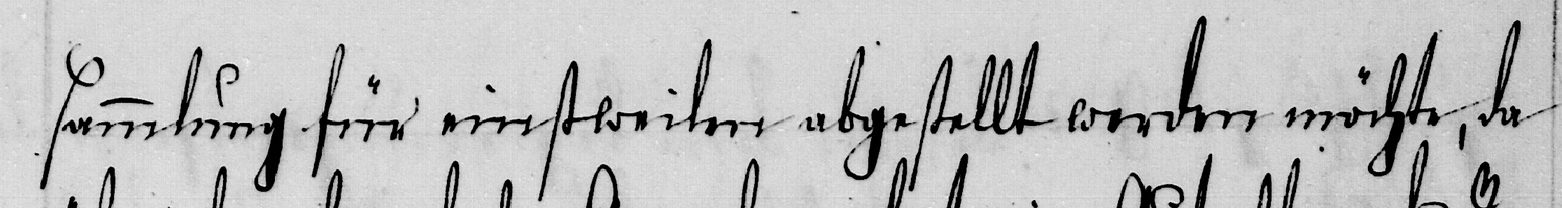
sammlung für einstweilen abgestellt werde möchte, da
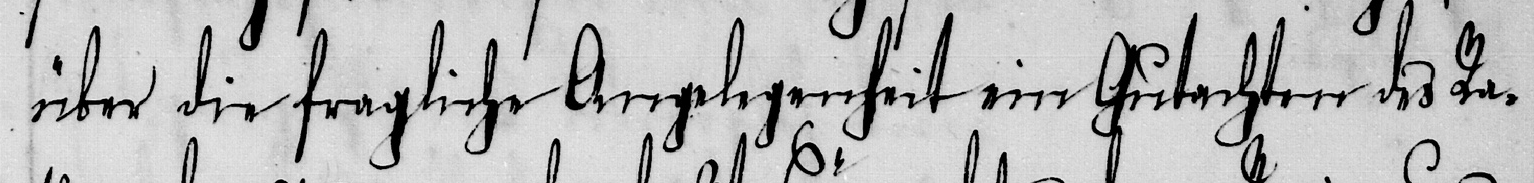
über die fragliche Angelegenheit ein Gutachten des Ra¬
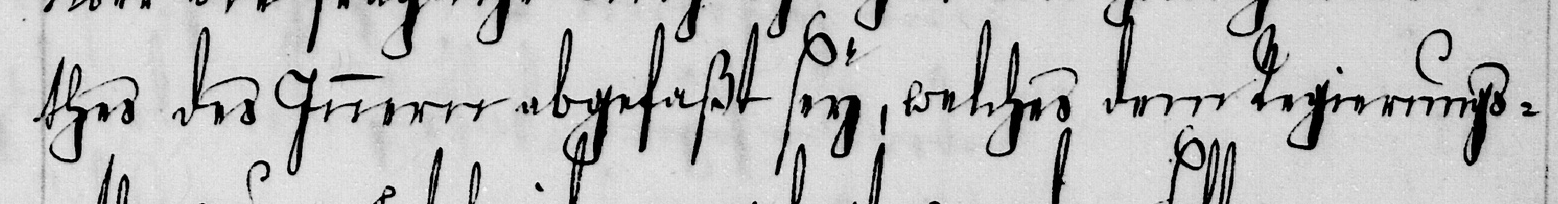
thes des Innern abgefasst sey, welches dem Regierungs¬
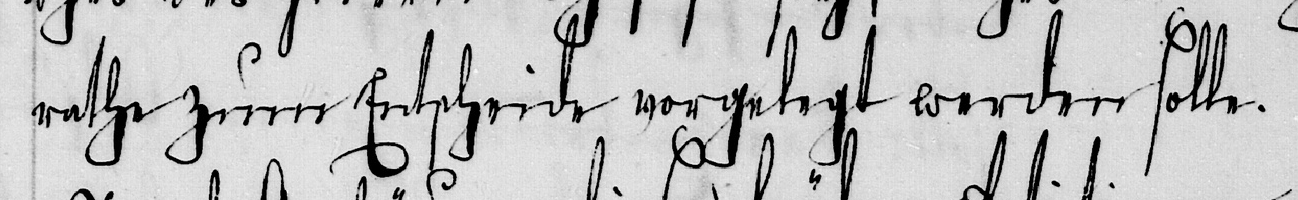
rathe zum Entscheide vorgelegt werden solle.
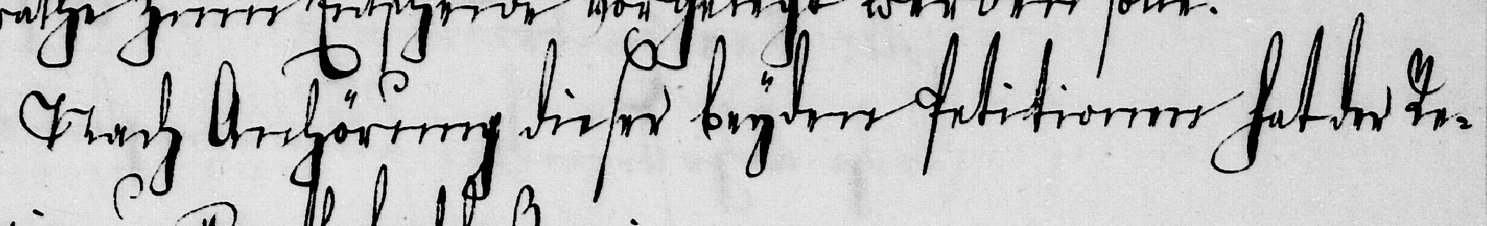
Nach Anhörung dieser beyden Petitionen hat der Re¬
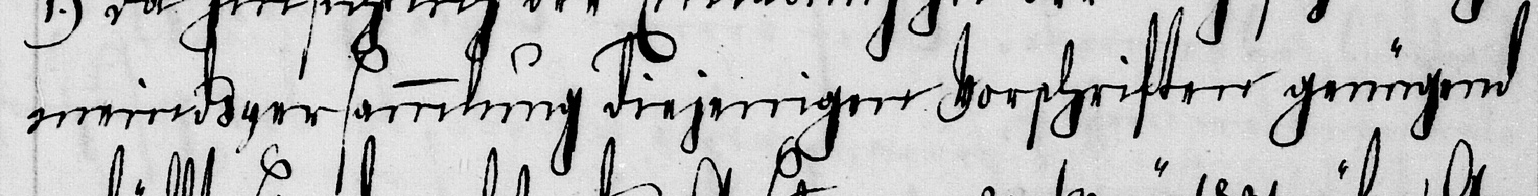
meindsversammlung diejenigen Vorschriften genügend
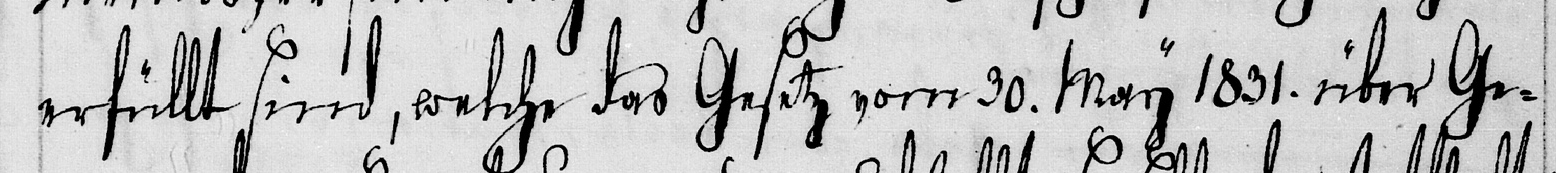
erfüllt sind, welche das Gesetz vom 30. May 1831. über Ge¬
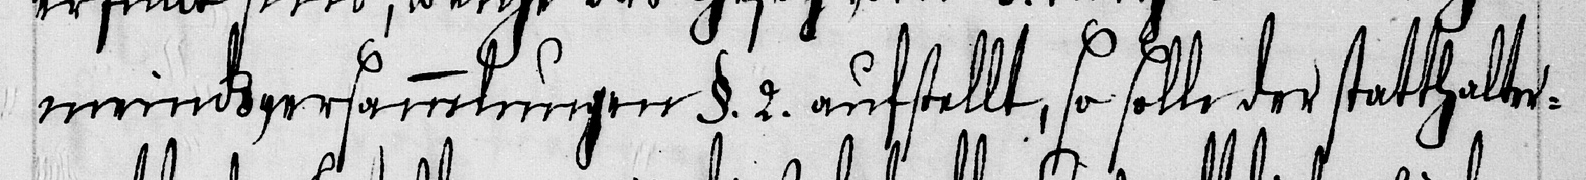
meindsversammlungen §. 2. aufstellt, so solle der stattha¬
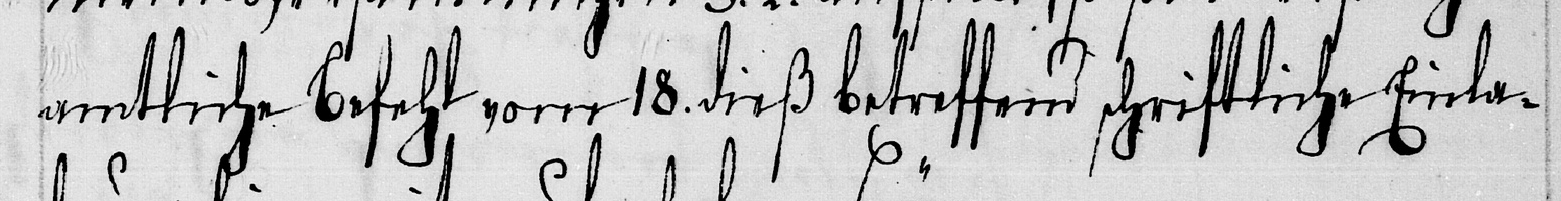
ramtliche Befehl vom 18. dieß betreffend schriftliche Ein¬
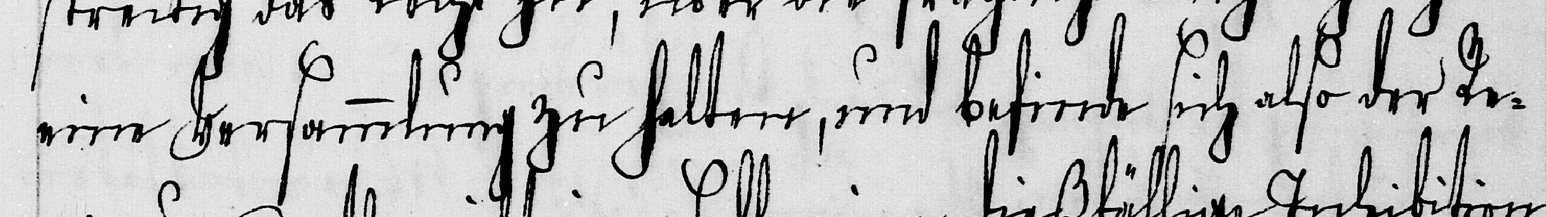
eine Versammlung zu halten, und befinde sich also der
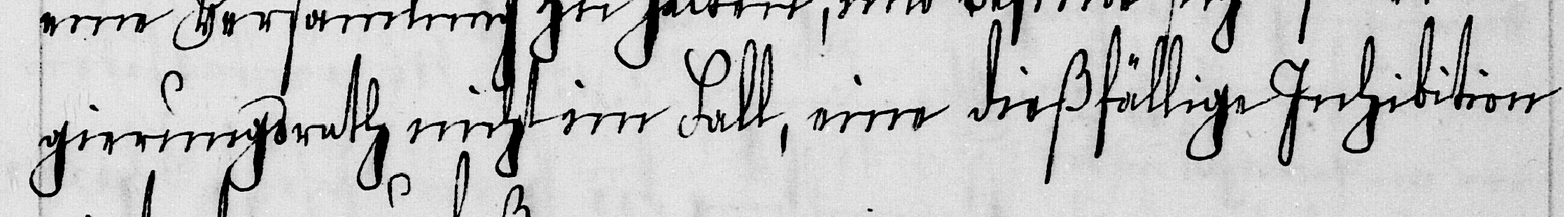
gierungsrath nicht im Fall, eine dießfällige Inhibition
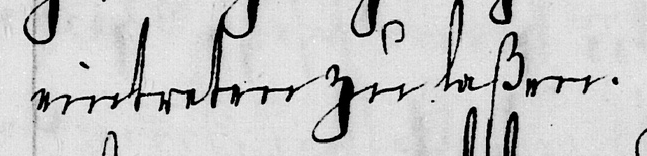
eintreten zu laßen.
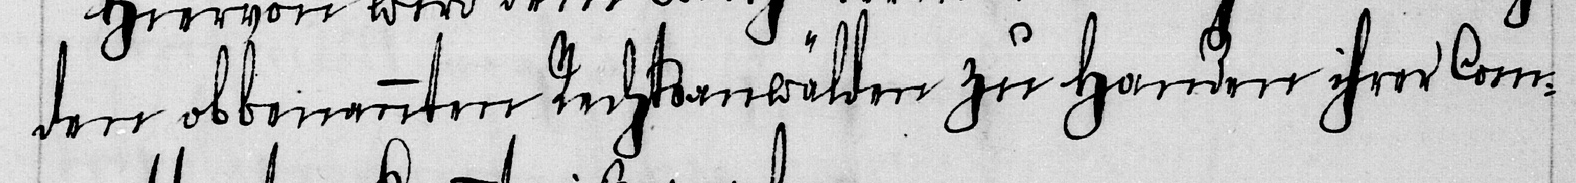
den obbenannten Rechtsanwälden zu Handen ihrer Co¬
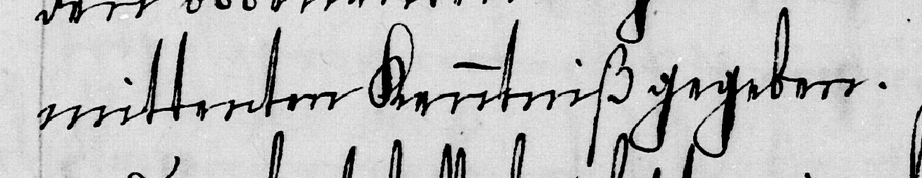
mittenten Kenntniß gegeben.
